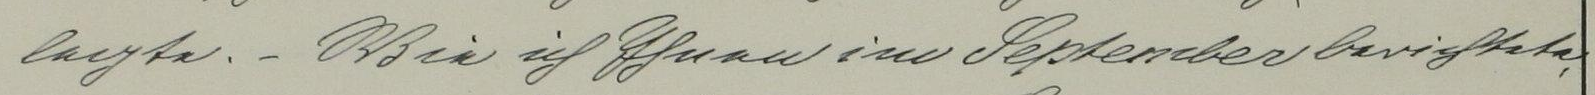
legte. – Wie ich Ihnen im September berichtete,
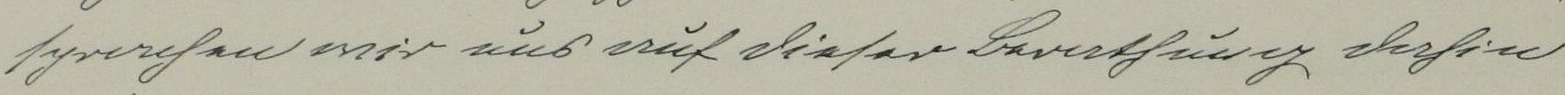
sprachen wir uns auf dieser Berathung dahin
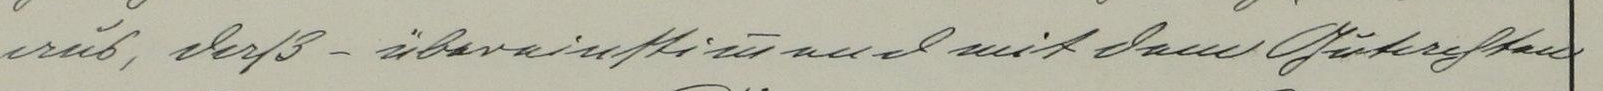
aus, daß – übereinstimmend mit dem Gutachten
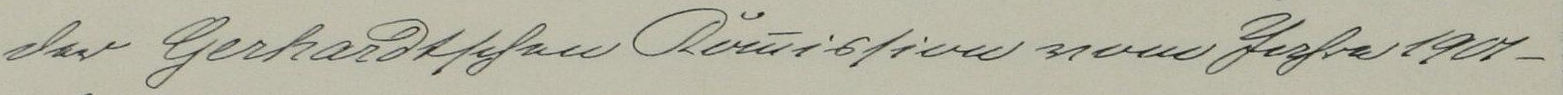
der Gerhardtschen Kommission vom Jahre 1901 –
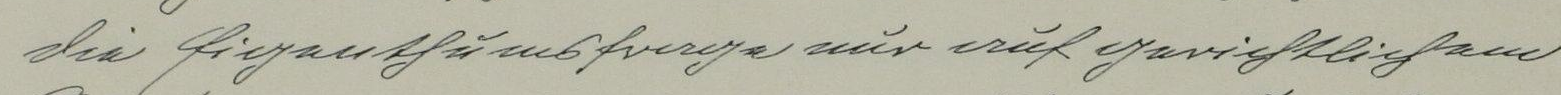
die Eigenthumsfrage nur auf gerichtlichem
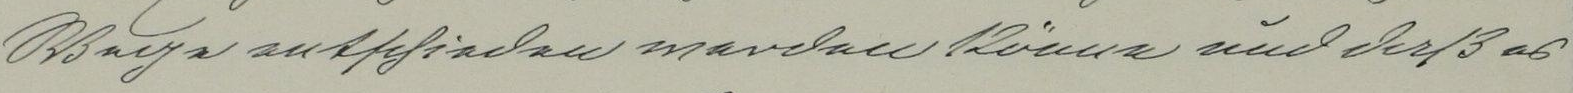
Wege entschieden werden könne und daß es
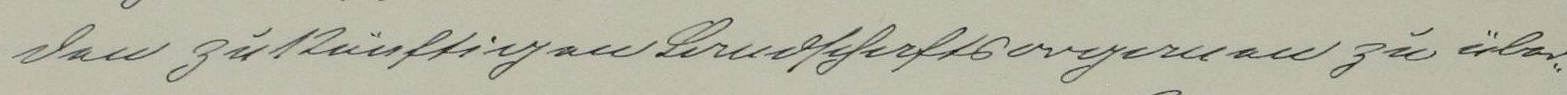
den zukünftigen Landschaftsorganen zu über-
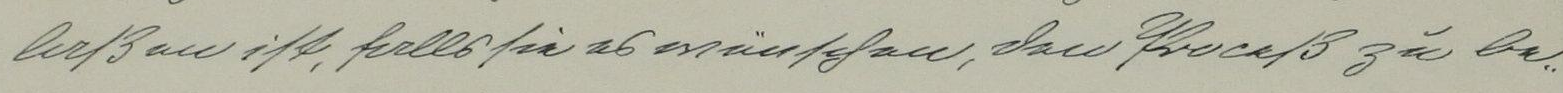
laßen ist, falls sie es wünschen, den Proceß zu be-
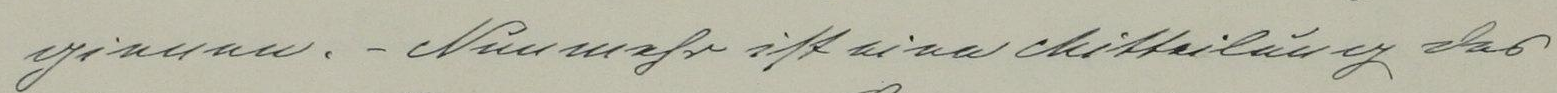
ginnen. – Nunmehr ist eine Mitteilung des
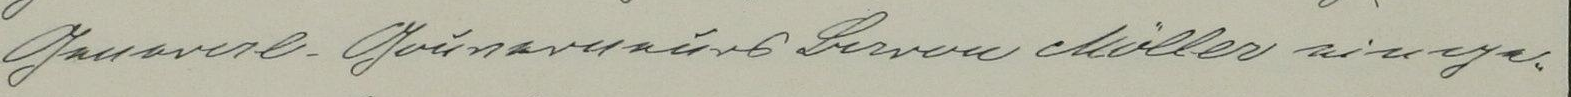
General-Gouverneurs Baron Möller einge-
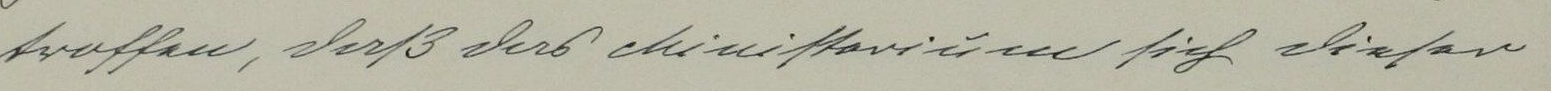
troffen, daß das Ministerium sich dieser
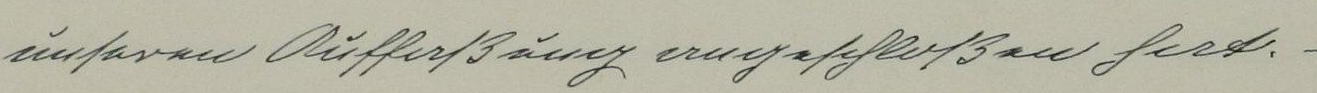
unseren Auffaßung angeschloßen hat.
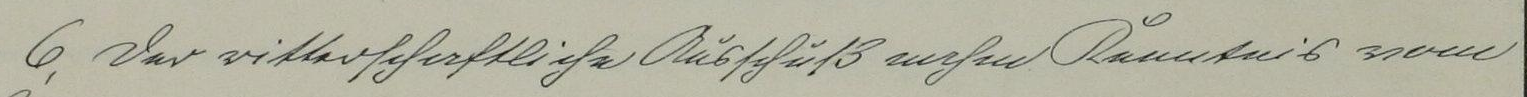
6. Der ritterschaftliche Ausschuß nahm Kenntnis vom
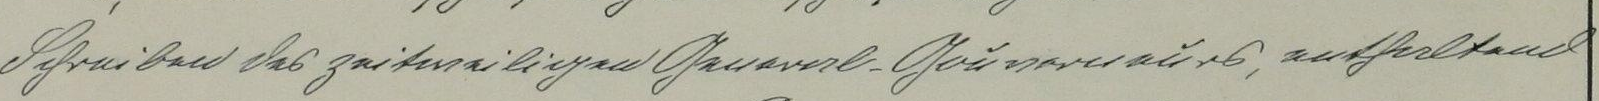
Schreiben des zeitweiligen General-Gouverneurs, enthaltend
